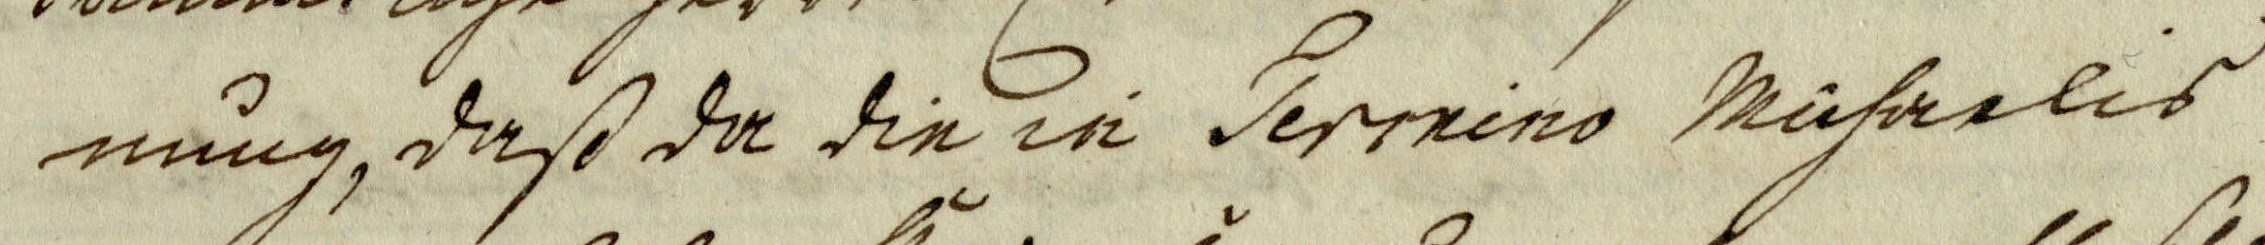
nung, daß da die in Termino Michaelis
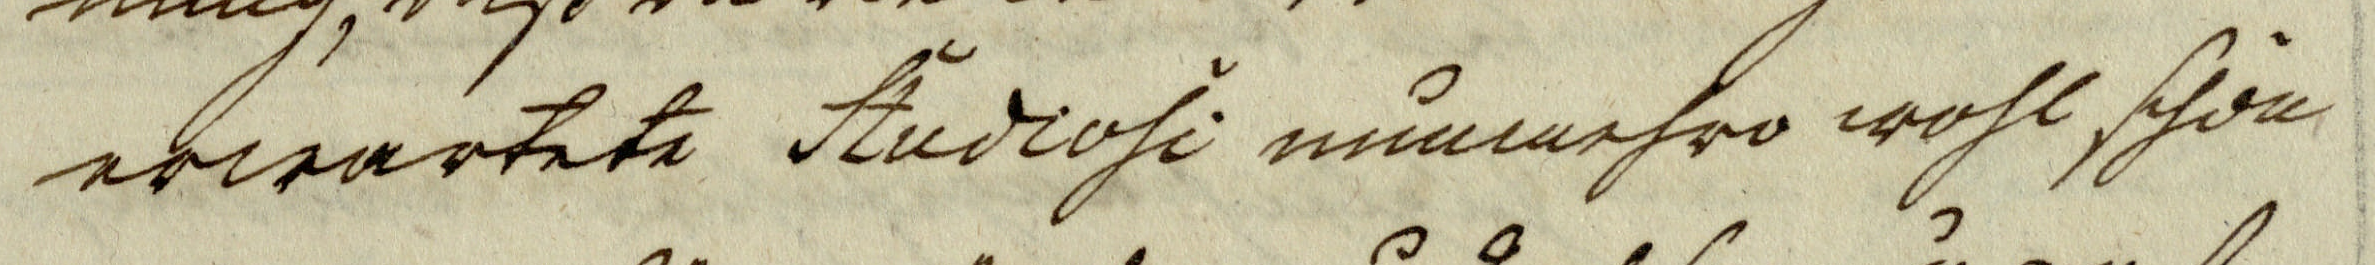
erwartete Studiosi nunmehro wohl schon
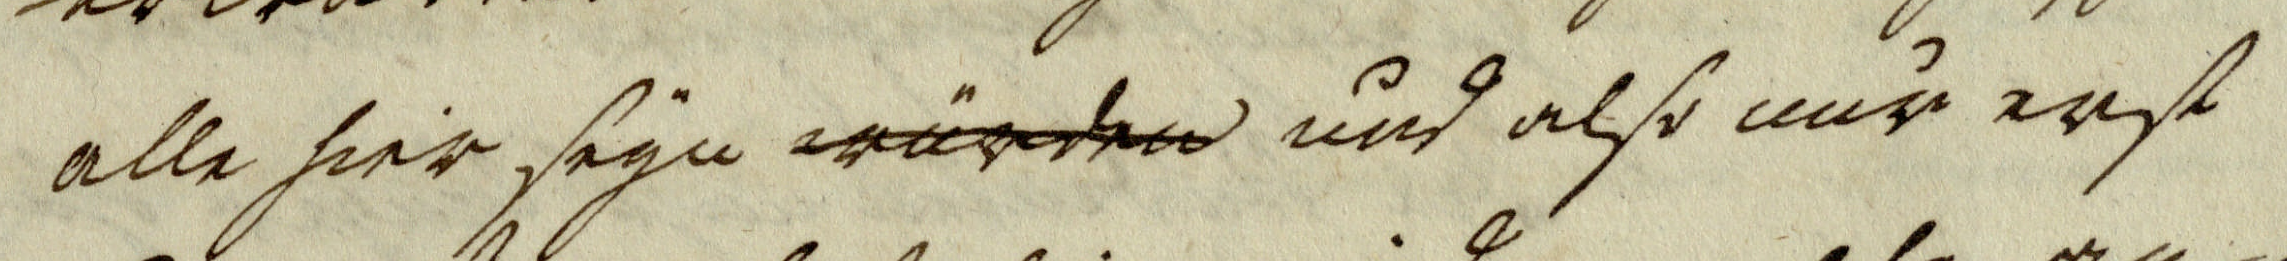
alle hier seÿn würden und also nur erst
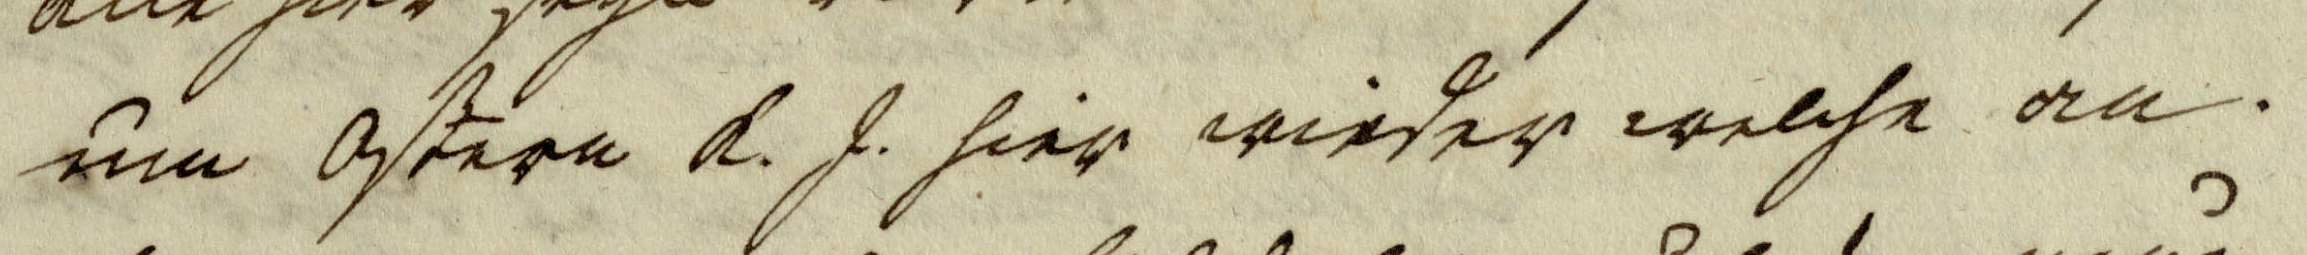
um Ostern K. J. hier wieder welche an¬
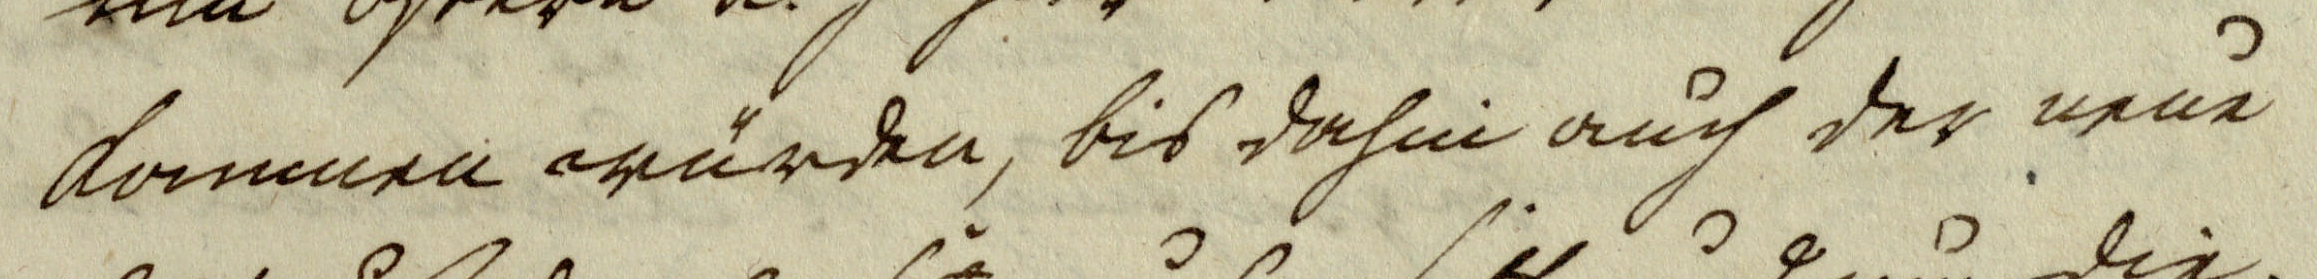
kommen würden, bis dahin auch der neue
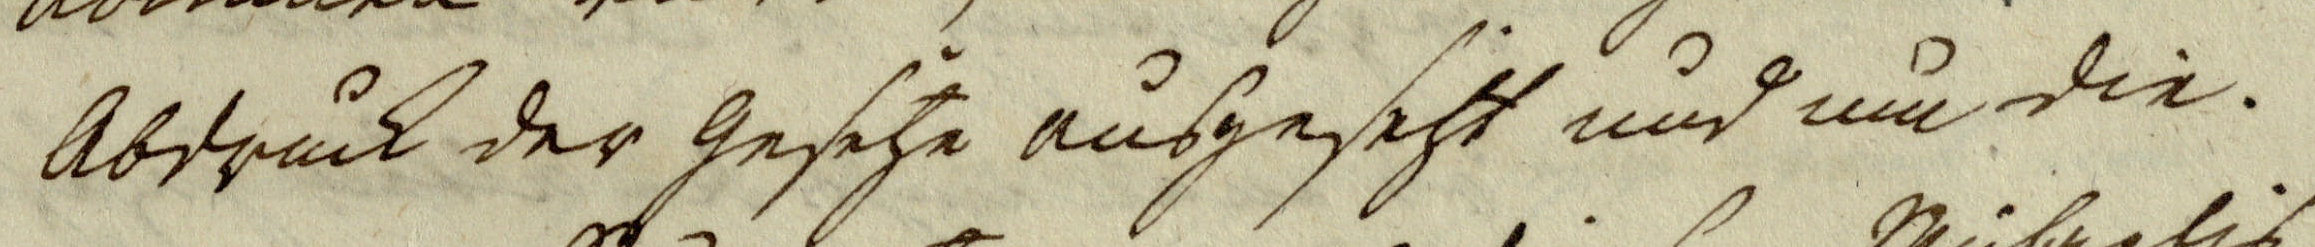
Abdruck der Gesetze ausgesetzt und um die¬
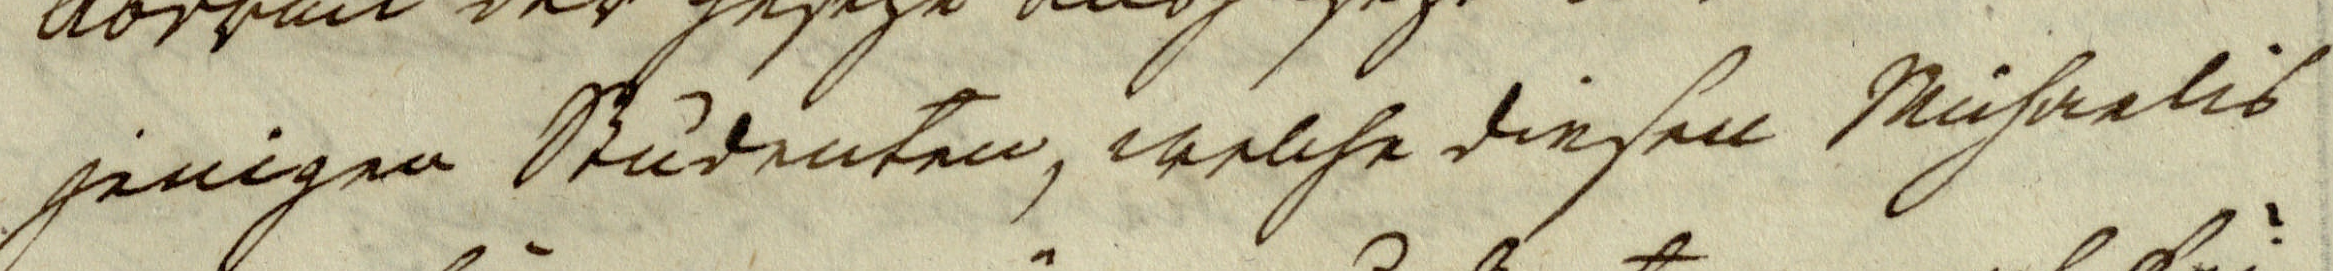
jenigen Studenten, welche diesen Michaelis
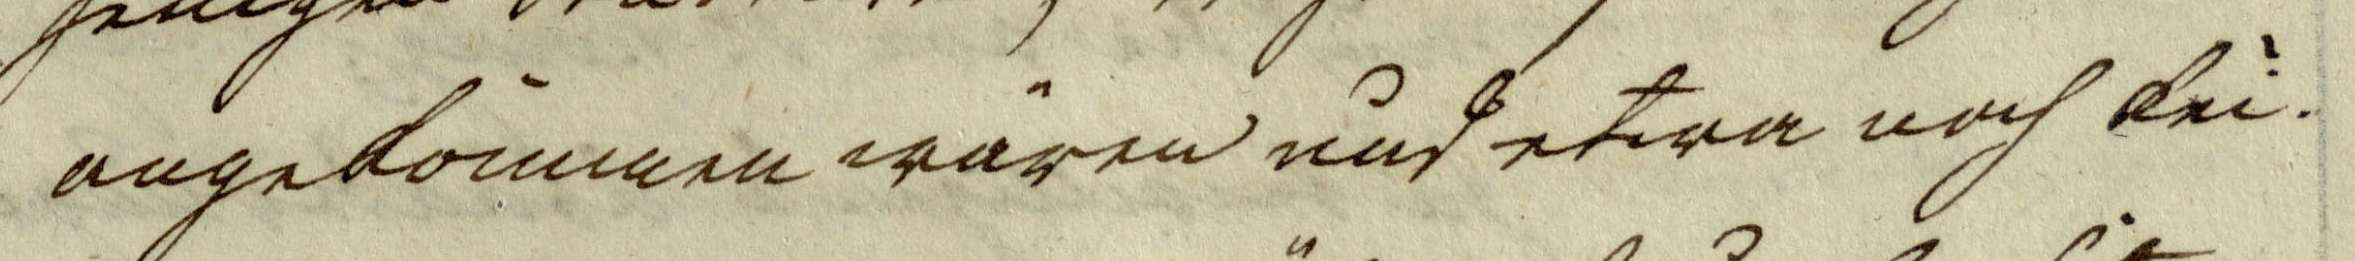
angekommen wären und etwa noch kei¬
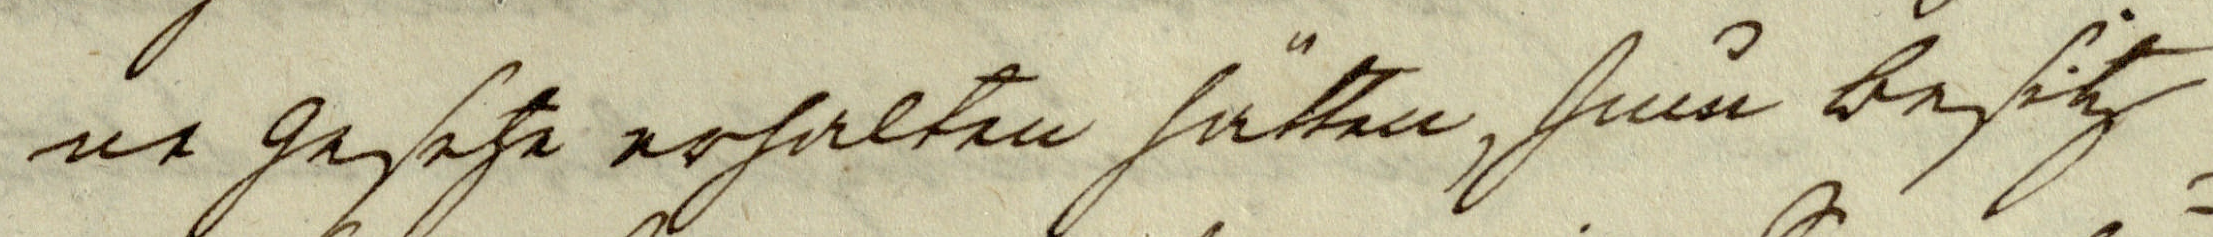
ne Gesetze erhalten hätten, zum Besitz
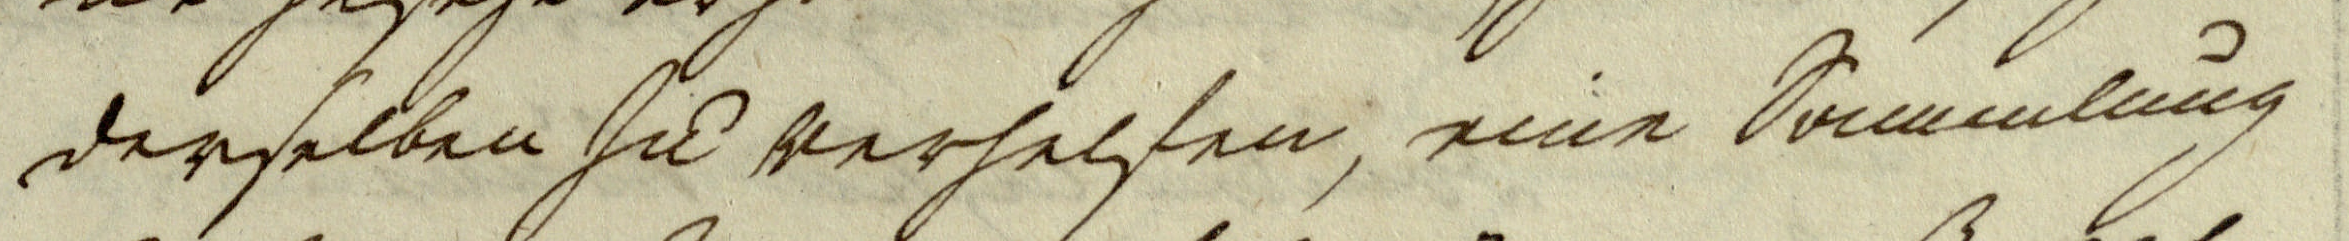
derselben zu verhelfen, eine Sammlung
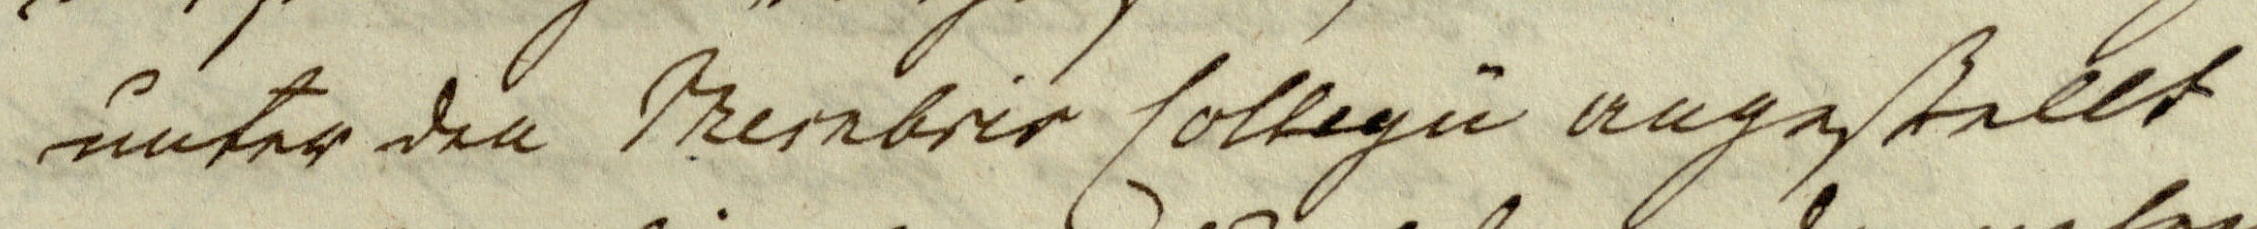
unter den Membris Collegii angestellt
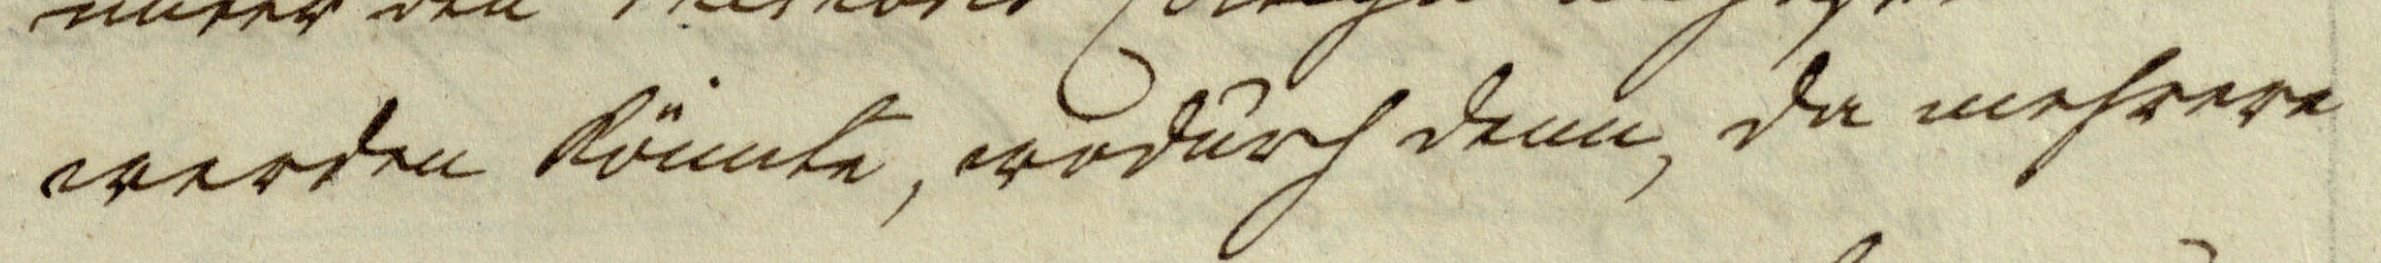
werden könnte, wodurch denn, da mehrere
